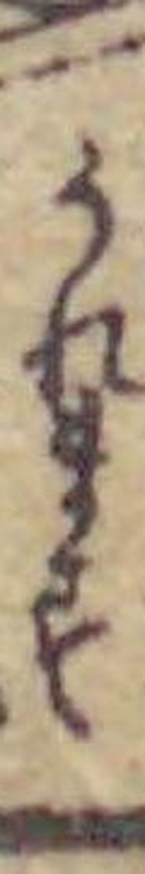うれます
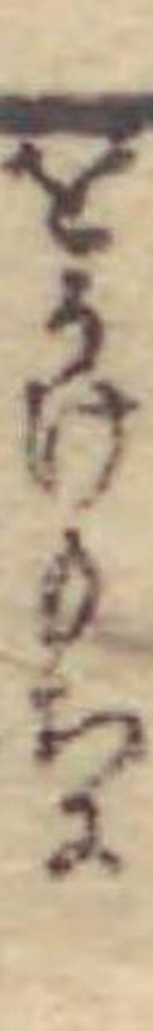をうけもちに
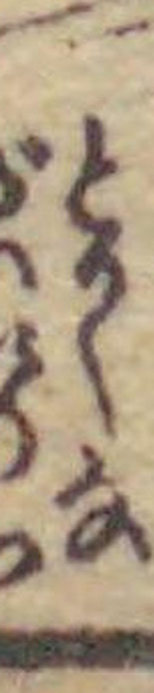とかくな
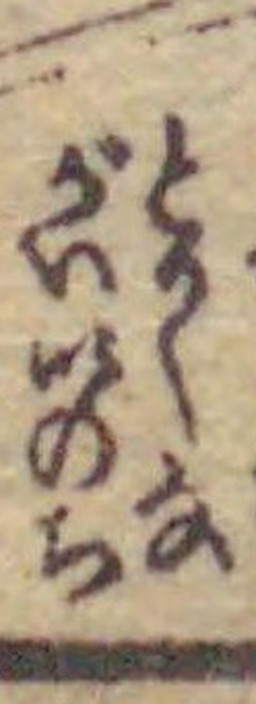がいいのち
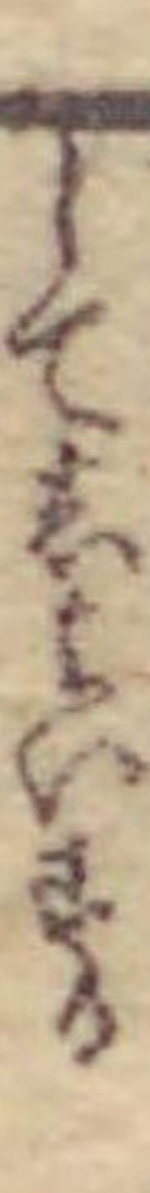してしはいする
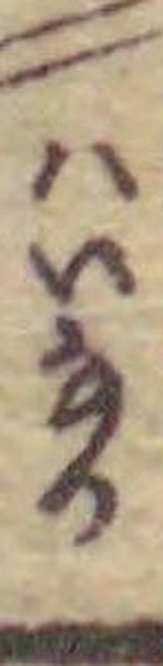はいなか
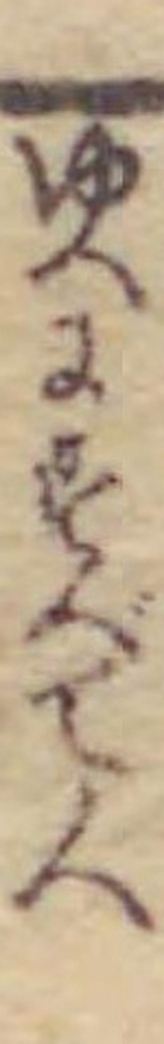ゆへにすべて人
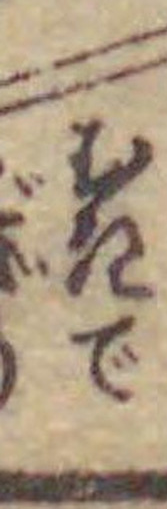むきで
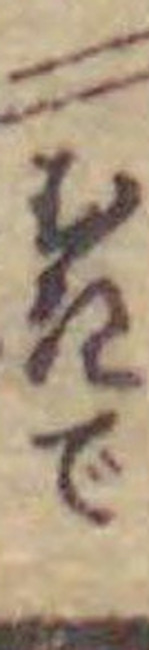むきで
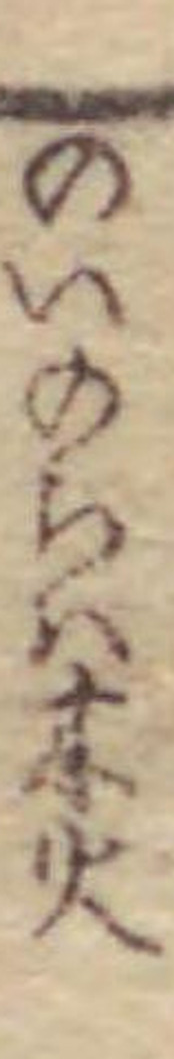のいのちは木火
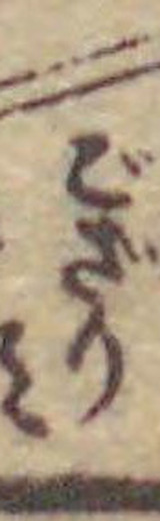ござり
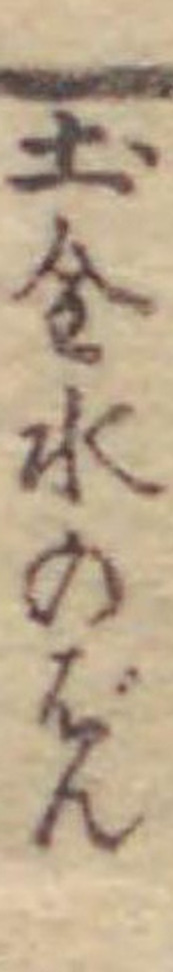土金水のばん
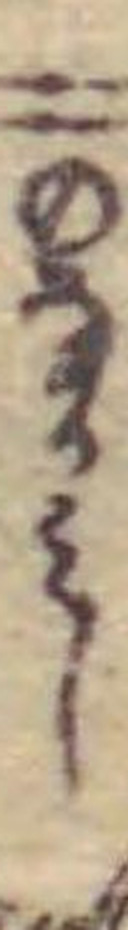のなかみし
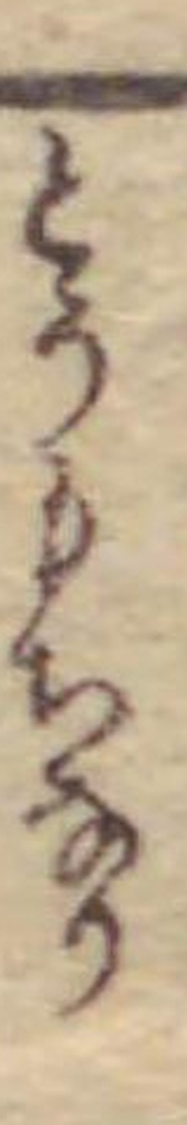とうもちなり
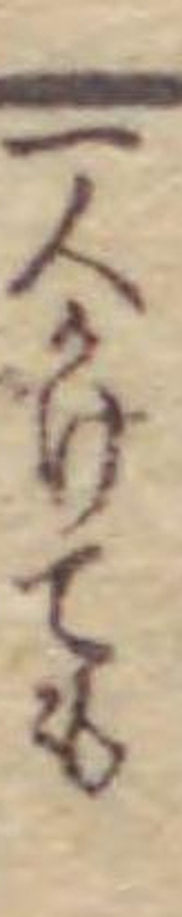一人かけても
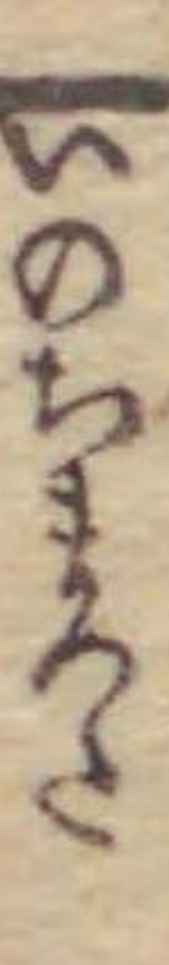いのちまつた
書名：御誂染長寿小紋 : 3巻
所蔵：国立国会図書館 National Diet Library, JAPAN
